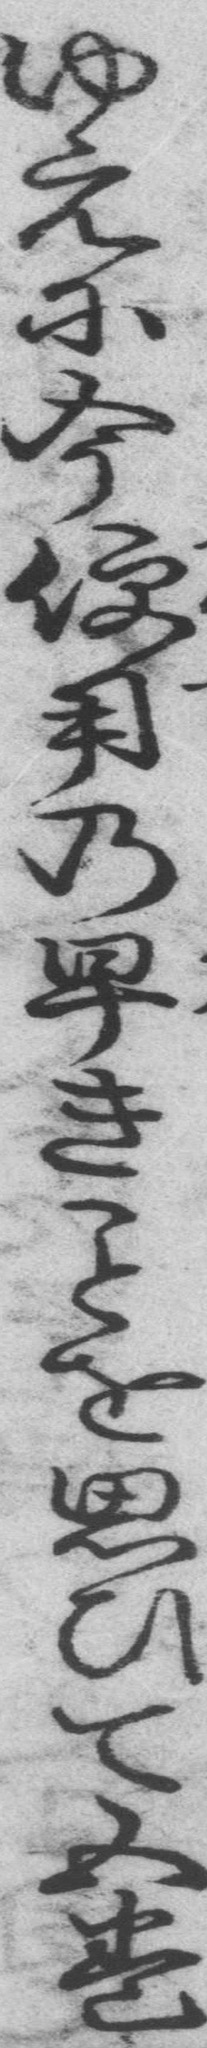ゆえ尓今便用乃早きことを思ひて五巻
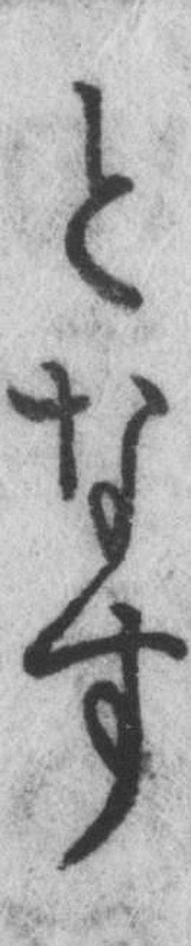となす

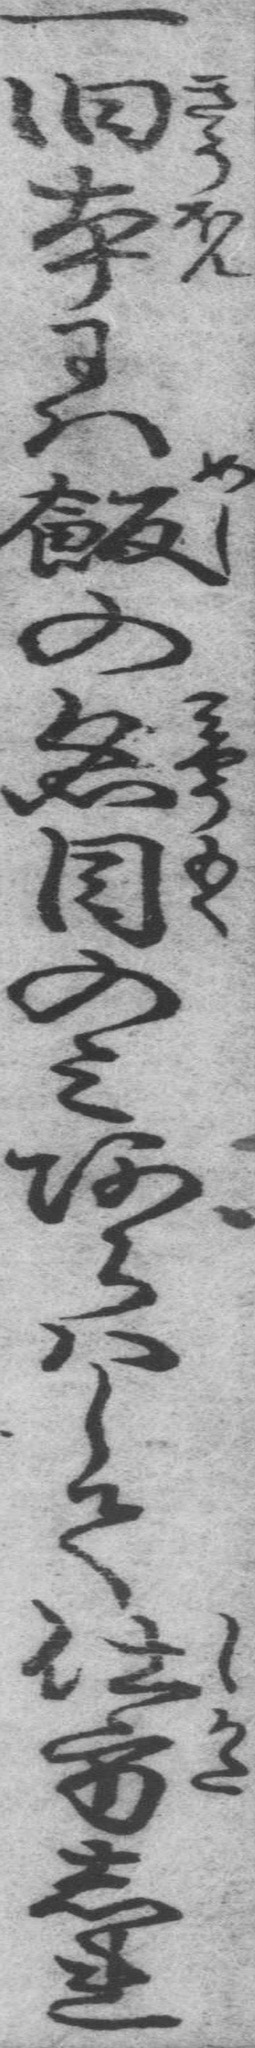一旧本尓は飯の名目のみ阿らはして仕方志連
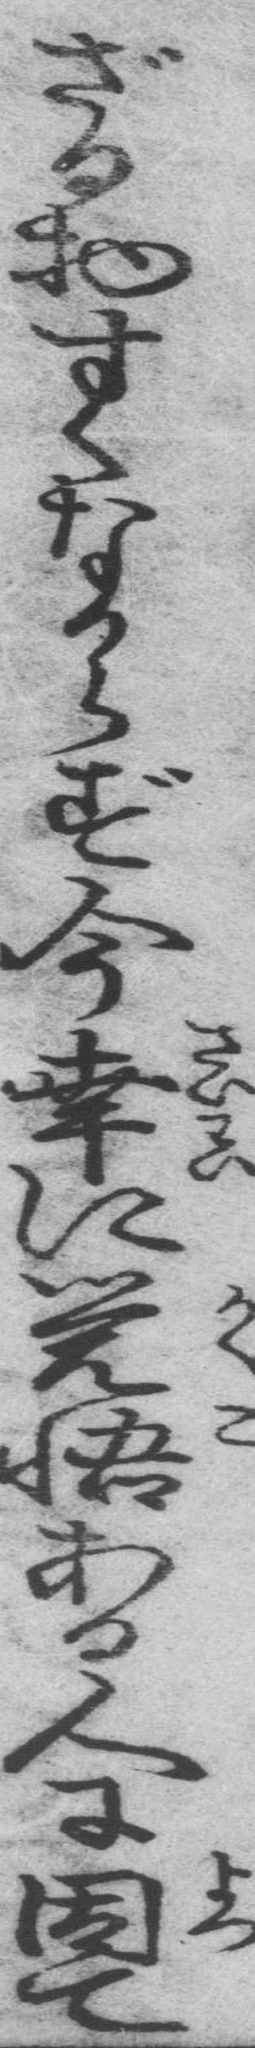ざる物すくなからず今幸に覚悟ある人尓因て
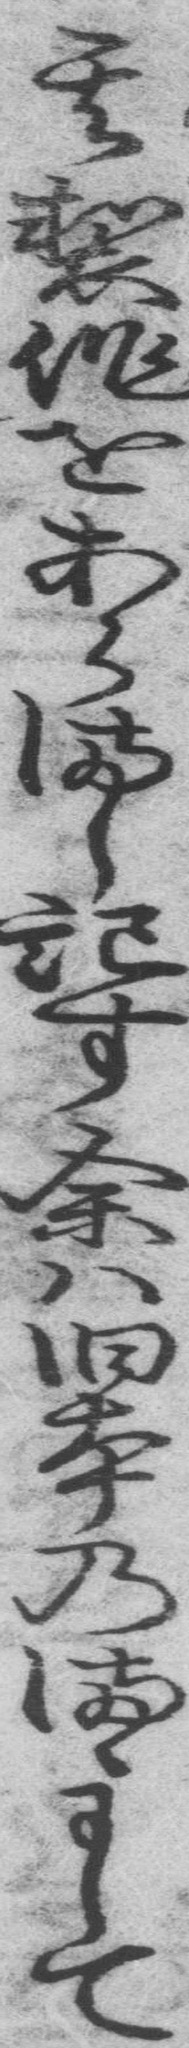其製作をあら満し記す余は旧本乃満々尓して
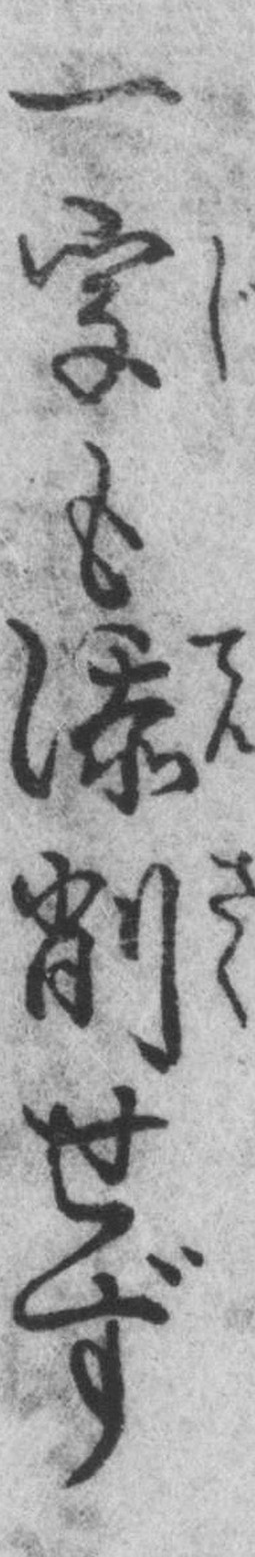一字も添削せず
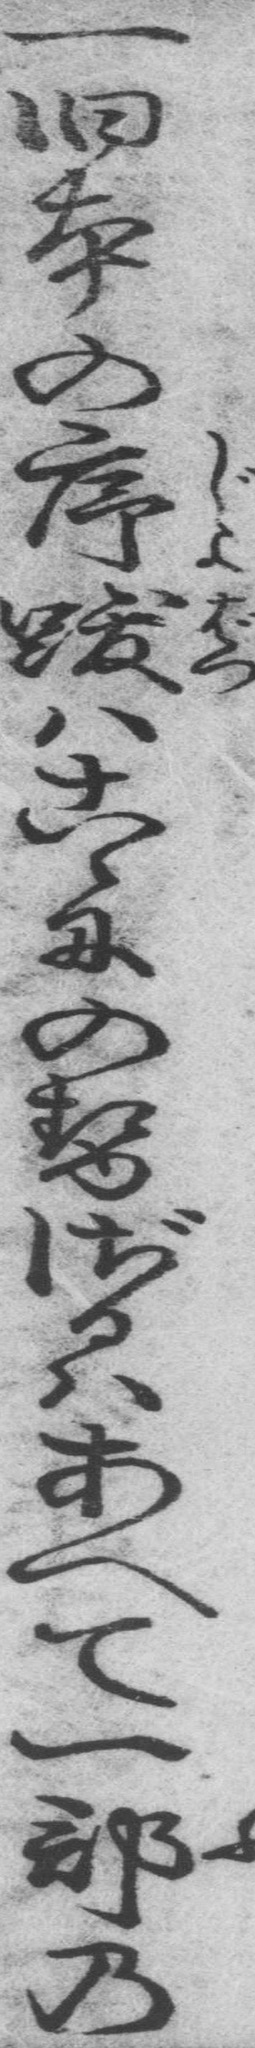一旧本の序跋は古々丹の勢ざるはあへて一部乃
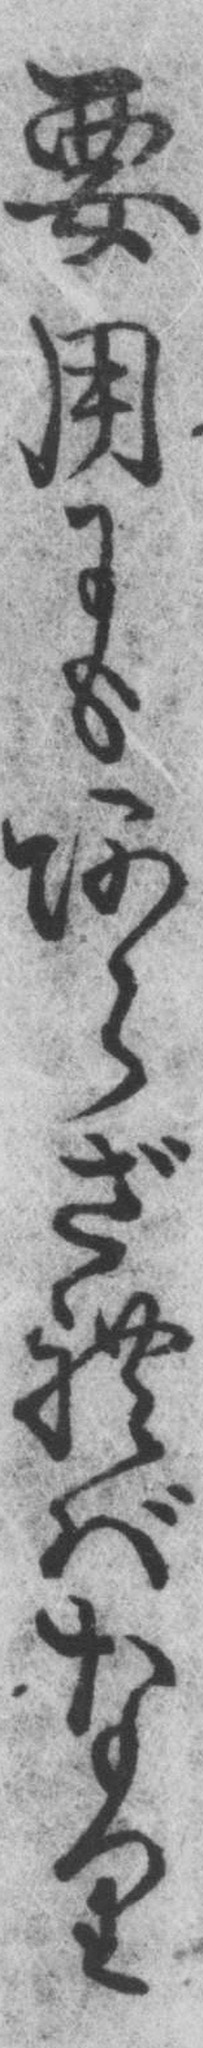要用尓も阿らざ禮ばな里
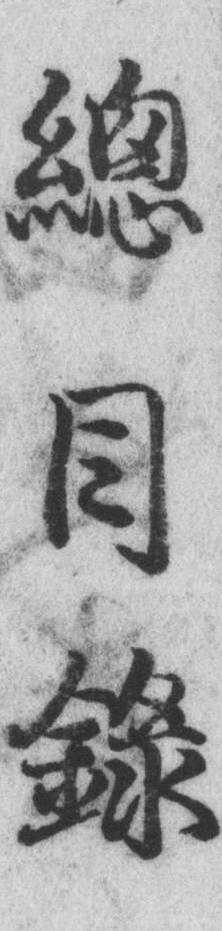總目録
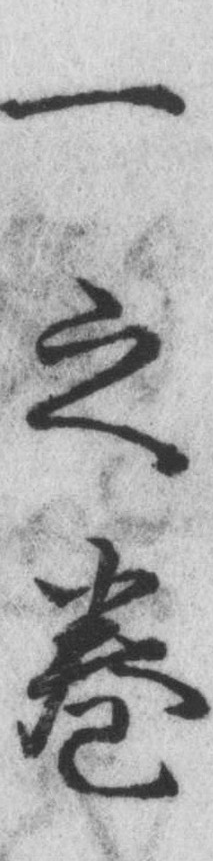一之巻
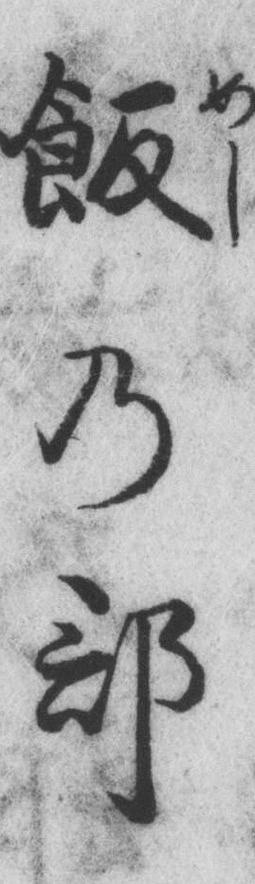飯乃部
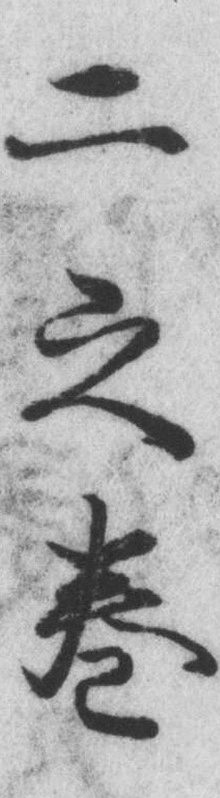二之巻

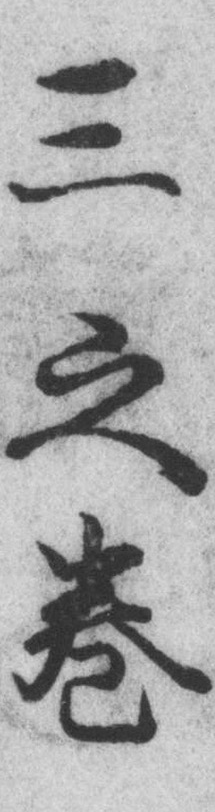三之巻
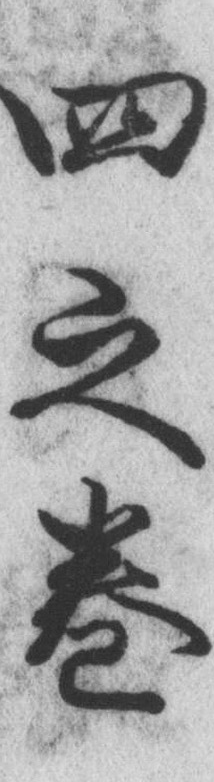四之巻

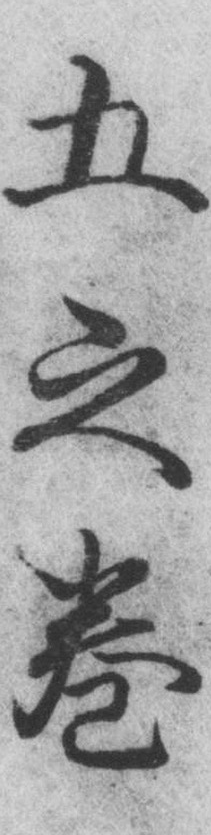五之巻
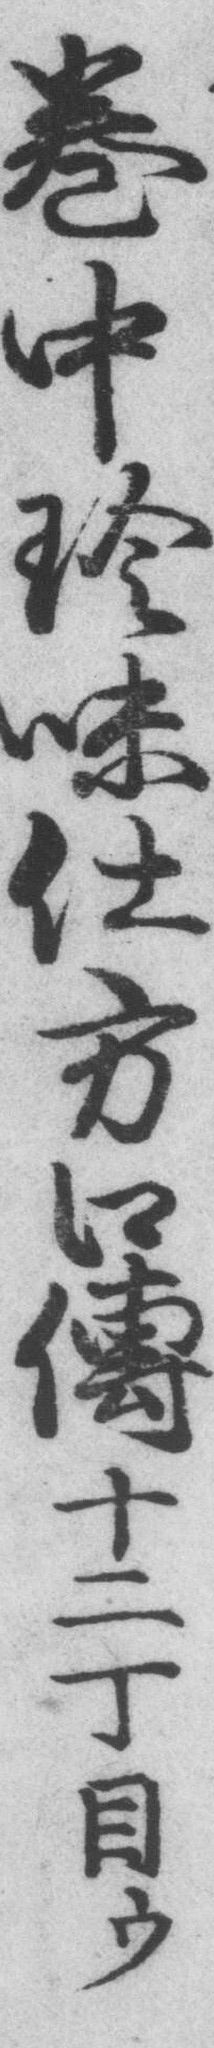巻中珍味仕方口傳十二丁目ウ
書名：料理伊呂波庖丁
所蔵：大阪府立大学学術情報センター 国文学研究資料館
